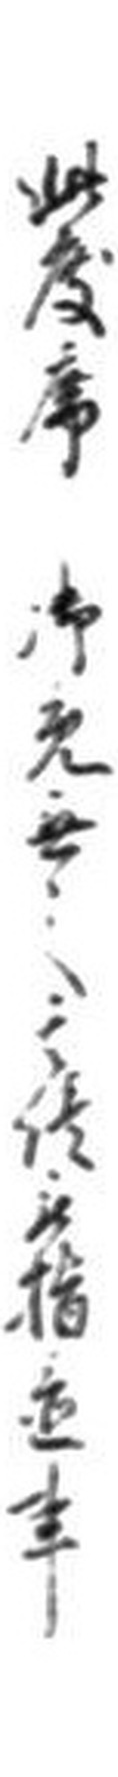此度席御免無之其儘被指置事
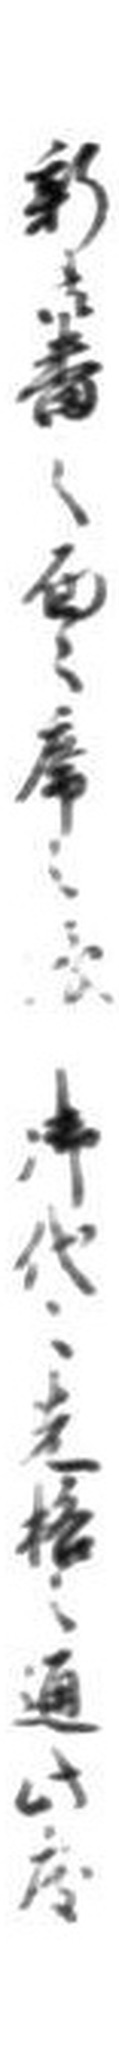新御番之面々席之儀御代々先格之通此度
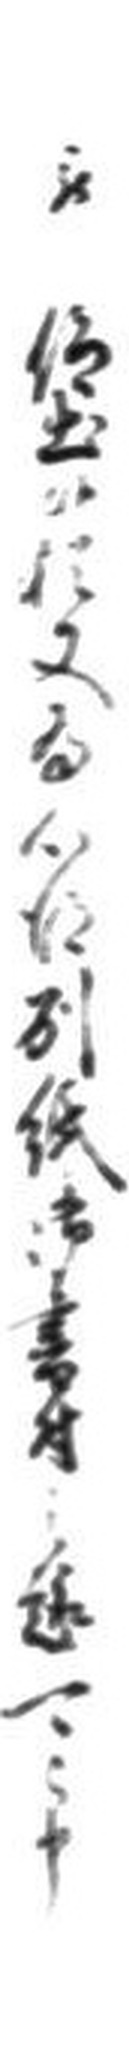被仰出候猶又為心得別紙御書付之趣可被申
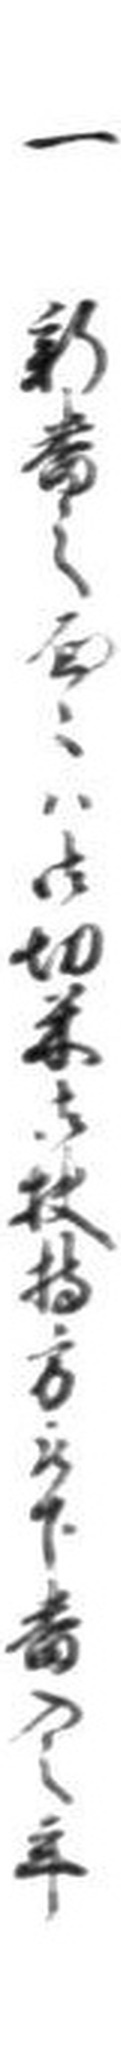一新番之面々ハ御切米御扶持方被下番入之年
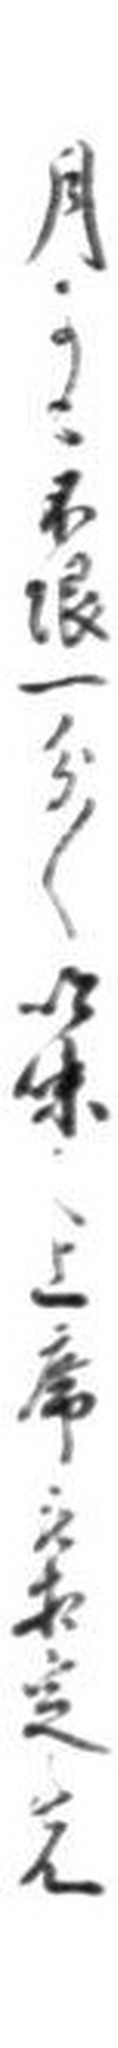月にも不限一分〳〵吟味之上席被相定先

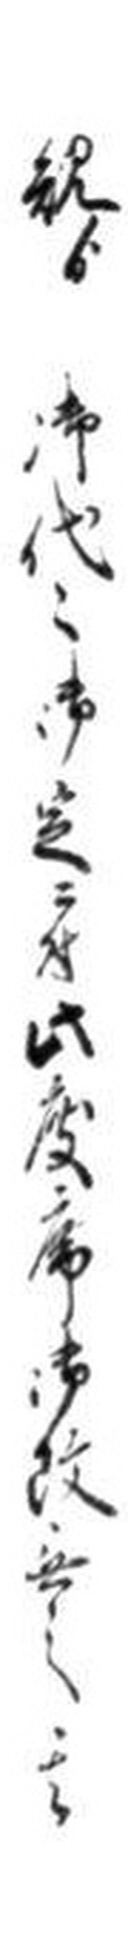規ゟ御代々御定ニ付此度席御改無之其
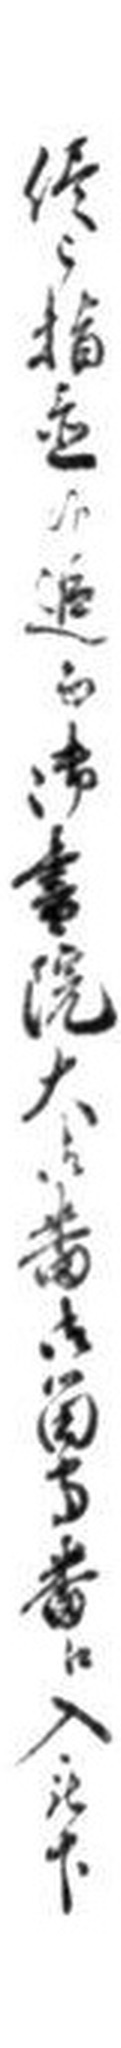儘被指置候追而御書院大御番御留守番江入被下
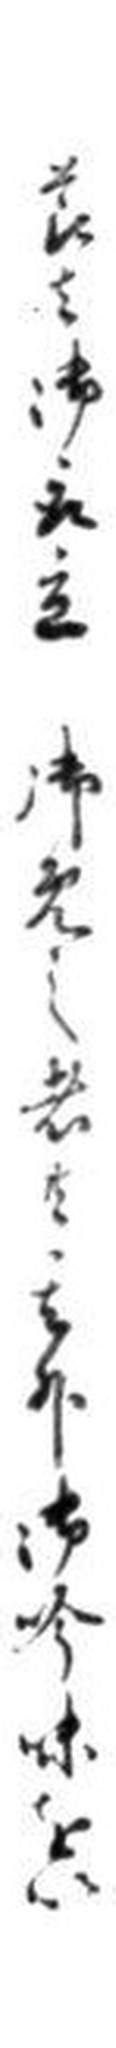節者御取立御免之者共其外御吟味を以
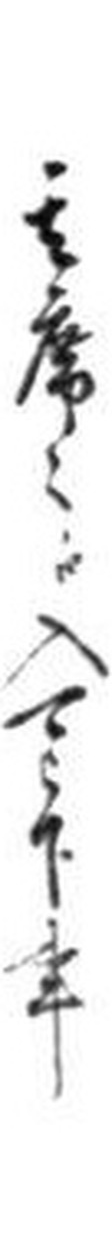其席々江入可被下事
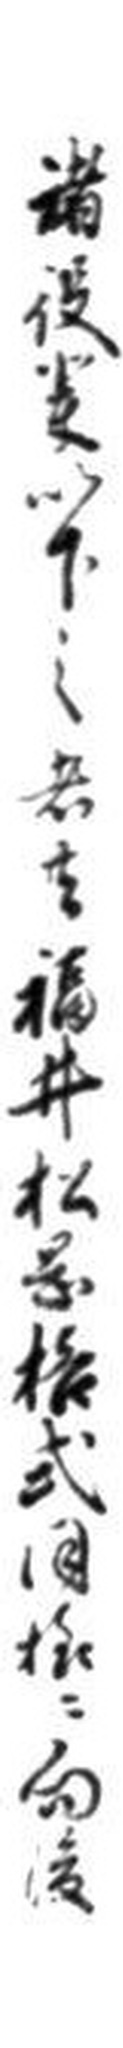諸役輩以下之者共福井松岡格式同様ニ向後
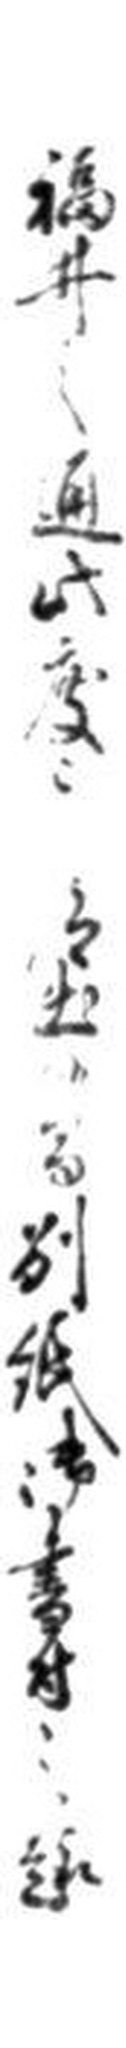福井之通此度被仰出候間別紙御書付之趣
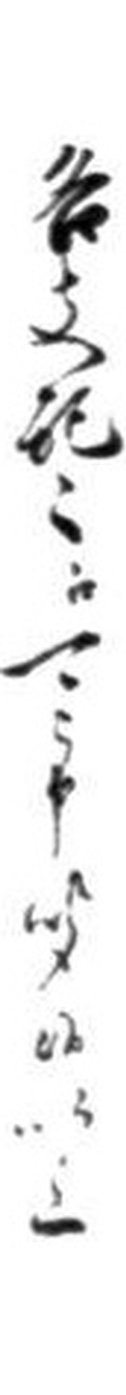各支配々江可被申聞候以上
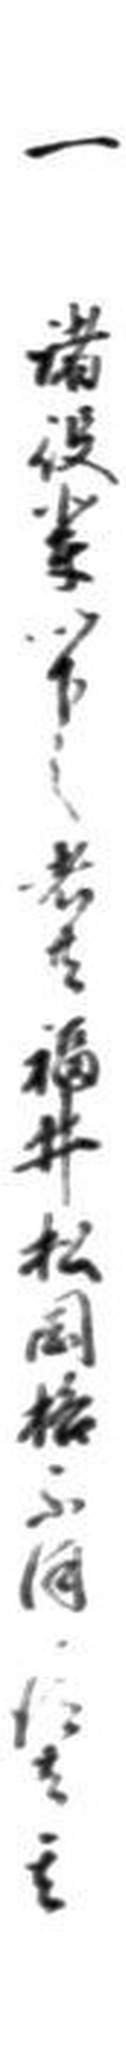一諸役輩以下之者共福井松岡格不同候得共其
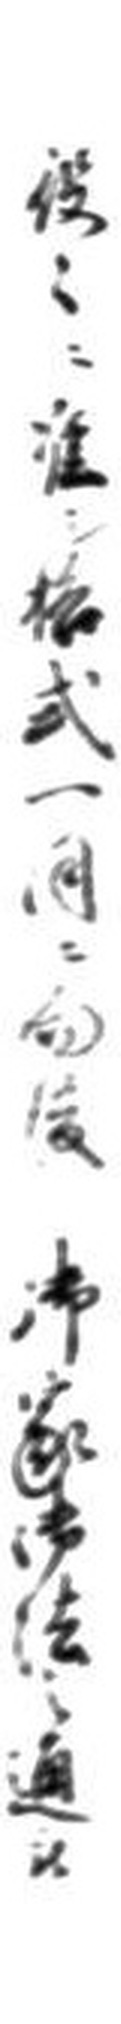役々ニ准シ格式一同ニ向後御家御法之通被
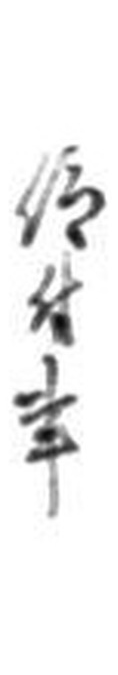仰付事
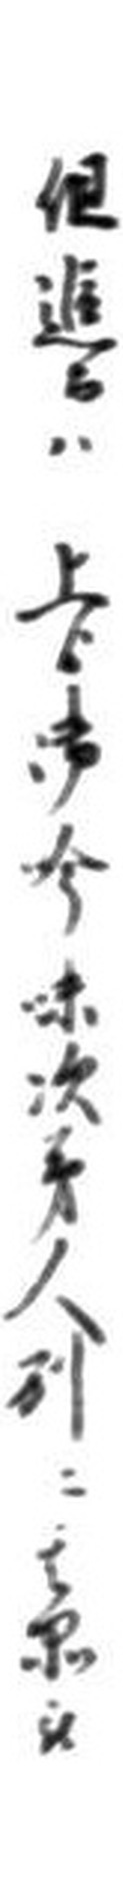但追而ハ上ゟ御吟味次第人別ニ其品被
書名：家譜 三十五 宗昌公 従享保六年到同七年
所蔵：福井県文書館 Fukui Prefectural Archives
